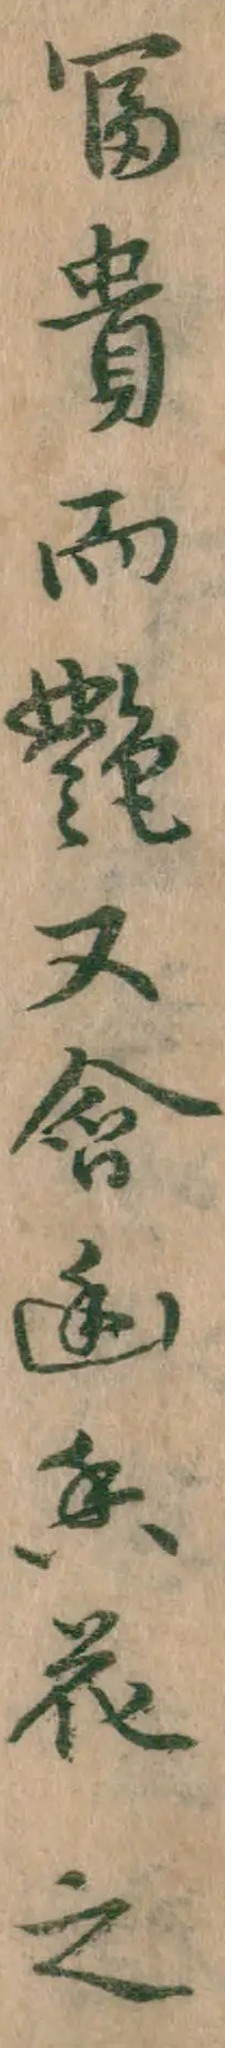富貴而艶又含幽香花之
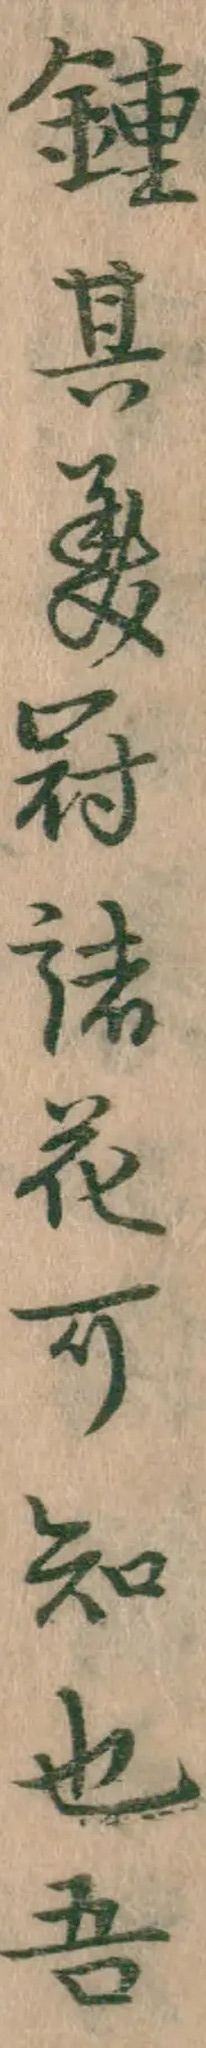鍾其美冠諸花可知也吾
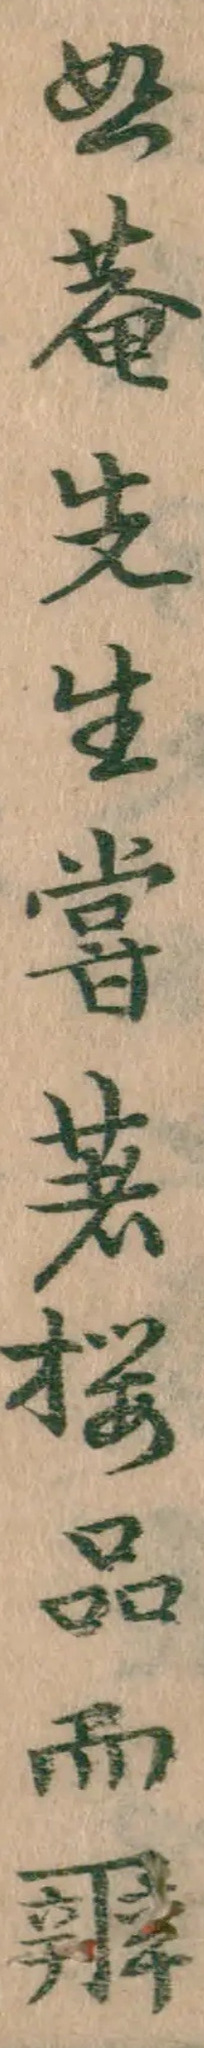恕菴先生嘗著桜品而
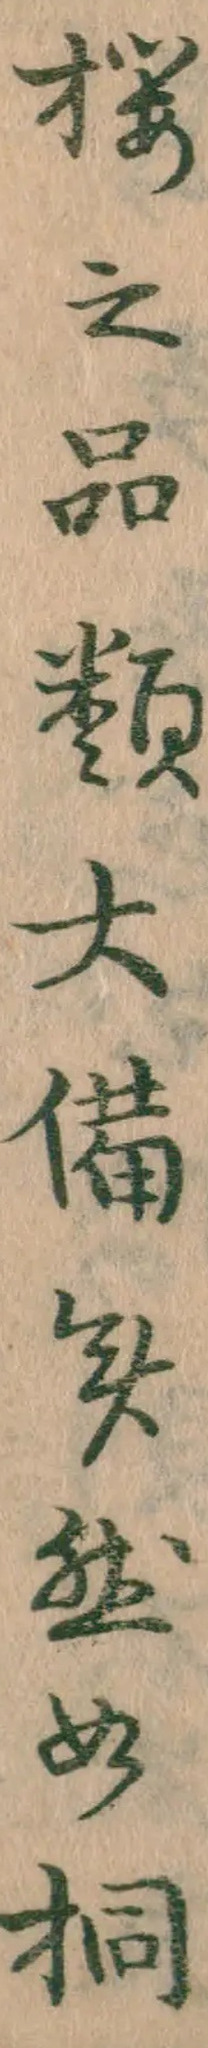桜之品類大備矣然如桐
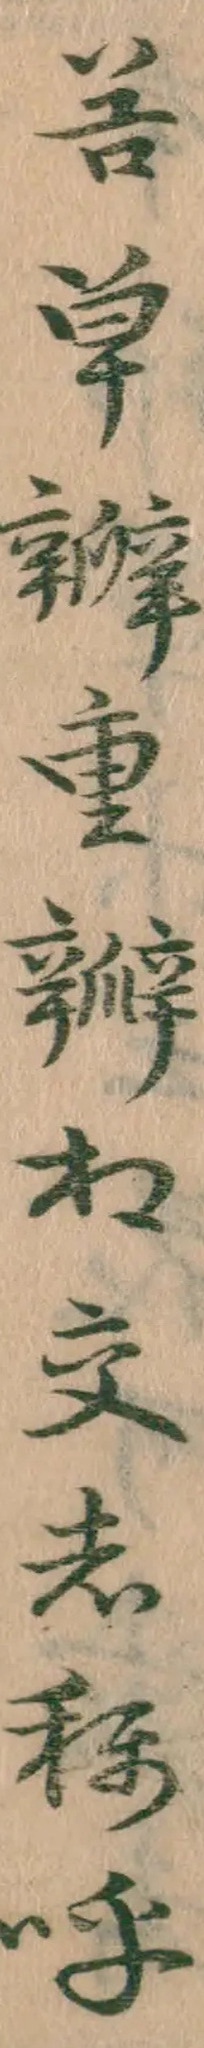谷単弁重弁相交者称呼
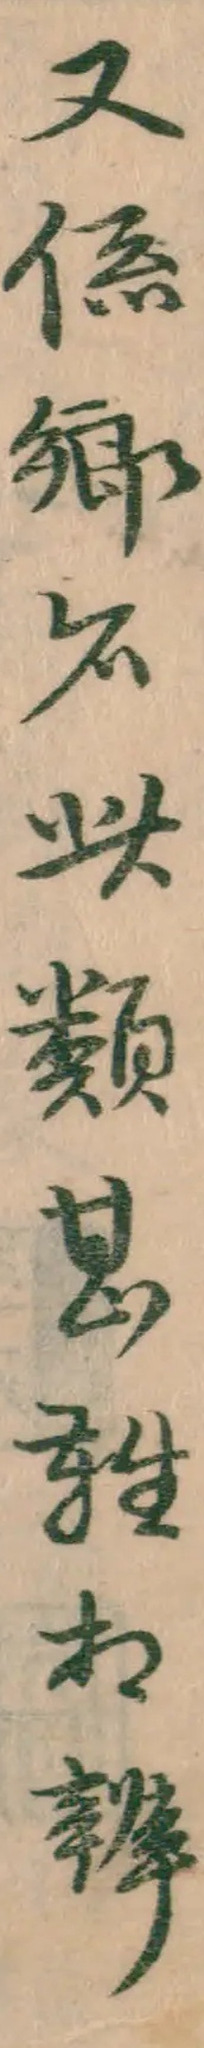又係郷名此類甚難相弁
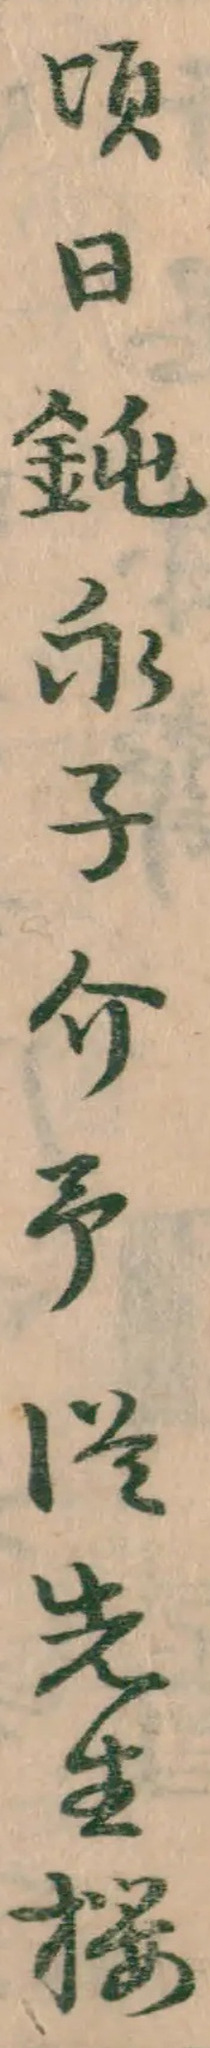頃日鈍永子介予従先生桜
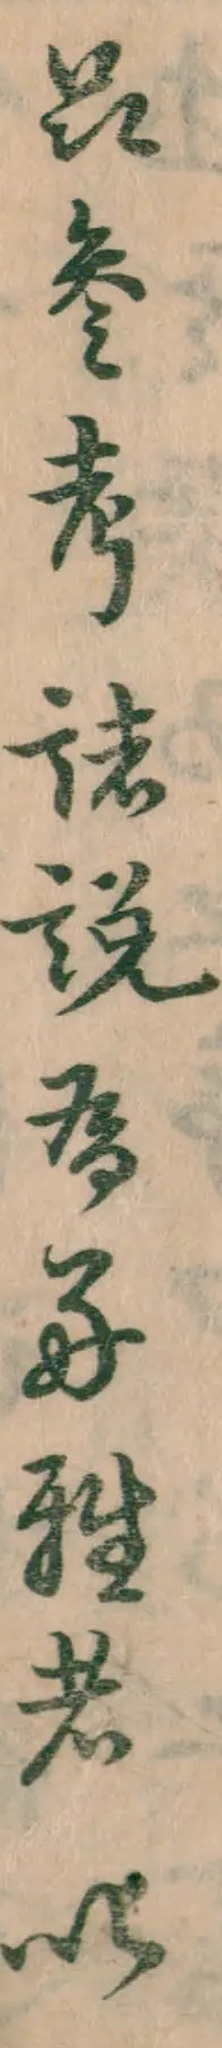品参考諸説為好雅者以
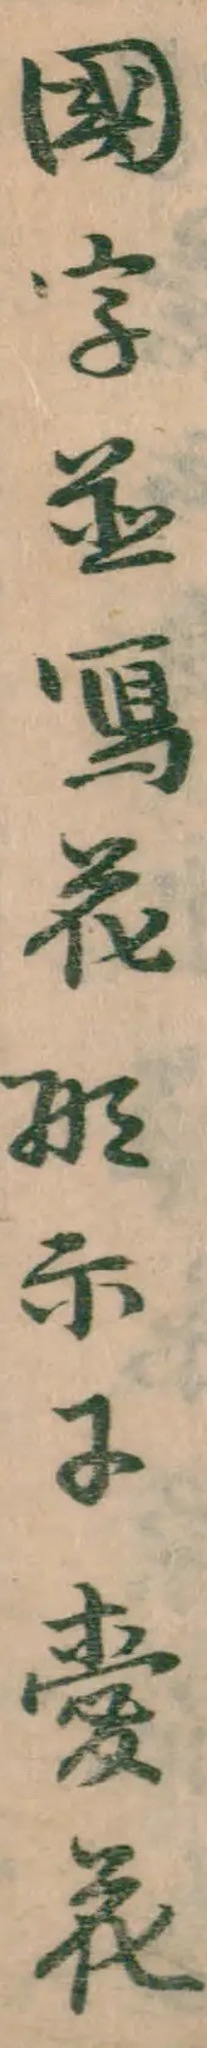国字並写花形示于愛花
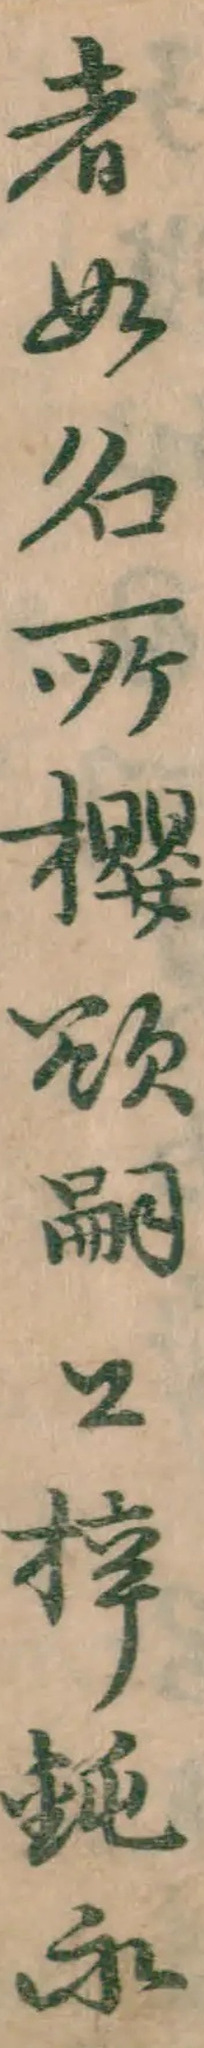者如名所桜欲嗣上梓鈍永

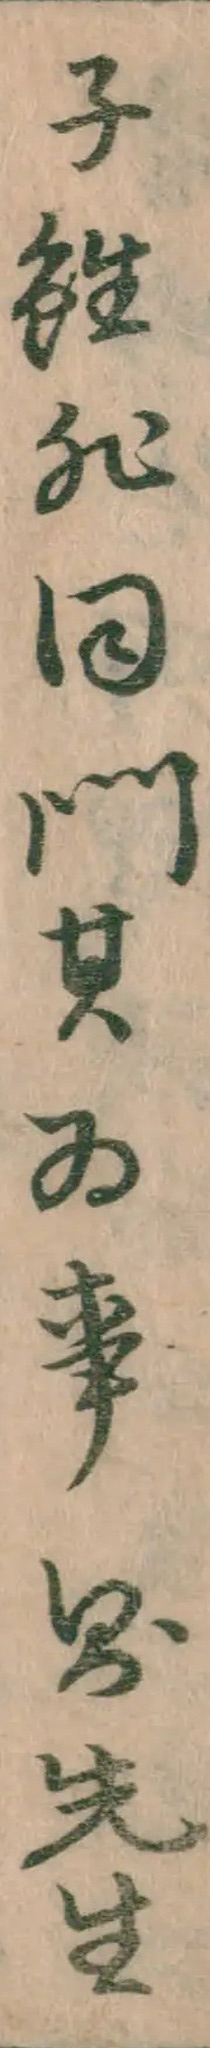子雖非同門其為事則先生
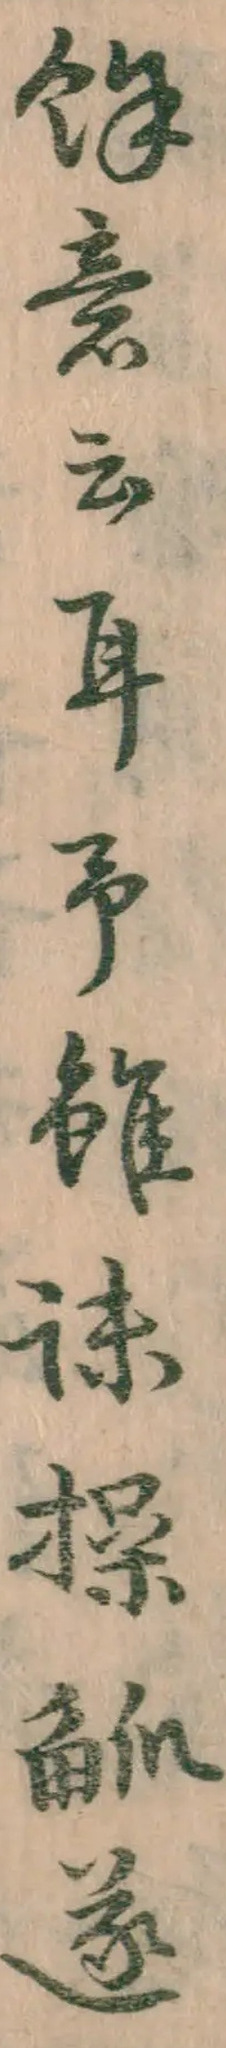余意云耳予雖操觚遂
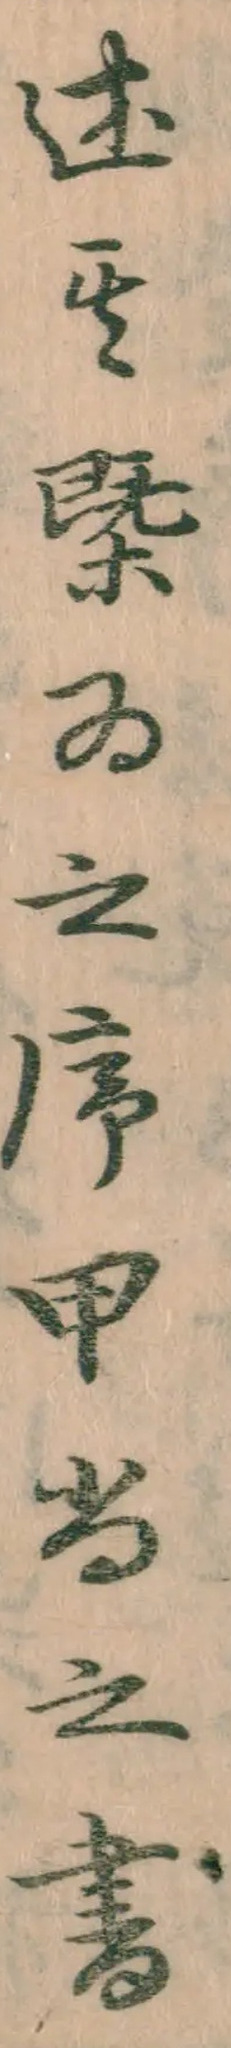述其概為之序甲尚之書
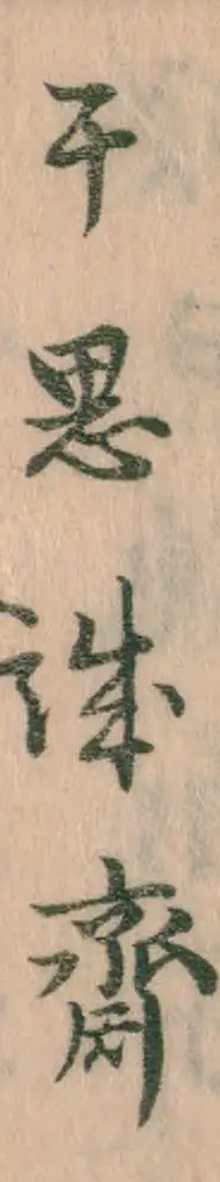于思誠斎
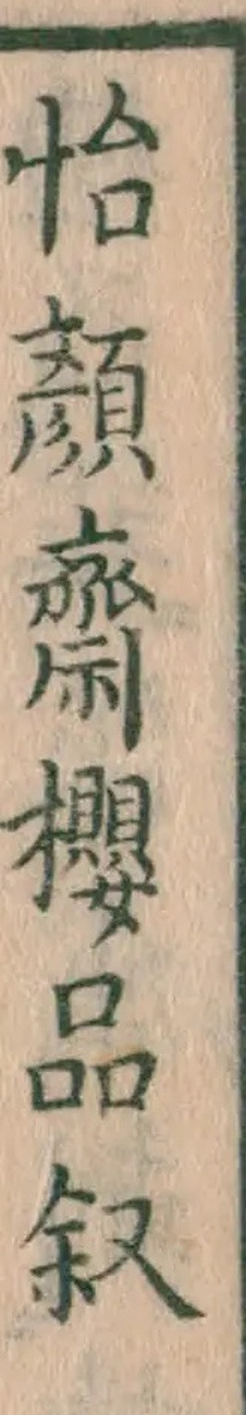怡顔斎桜品叙
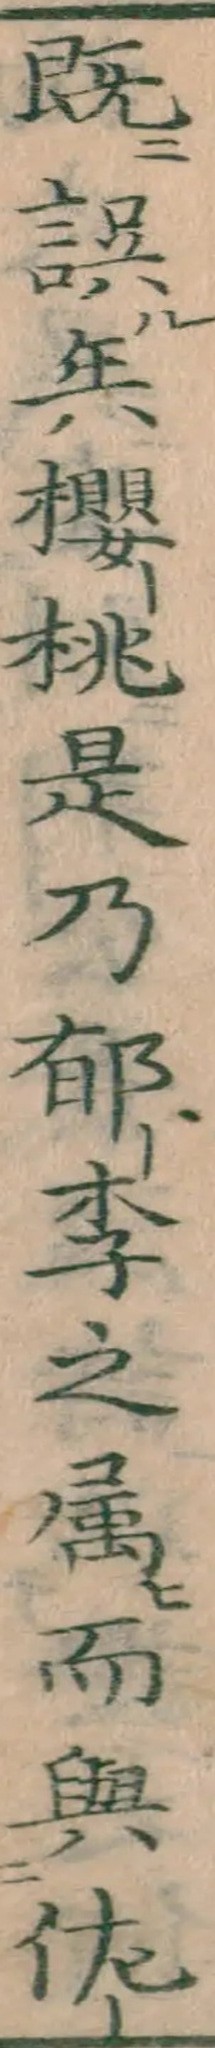既誤矣桜-桃是乃郁-李之属而与佐-
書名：怡顔齋櫻品
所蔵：国立国会図書館 National Diet Library, JAPAN
